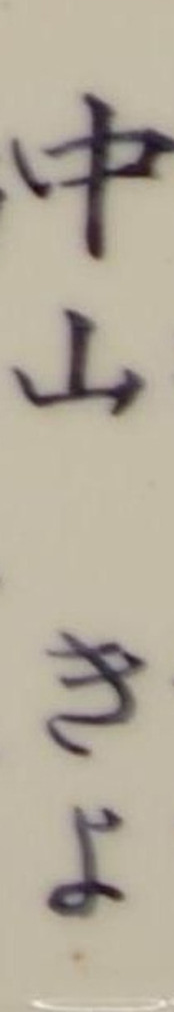中山きよ
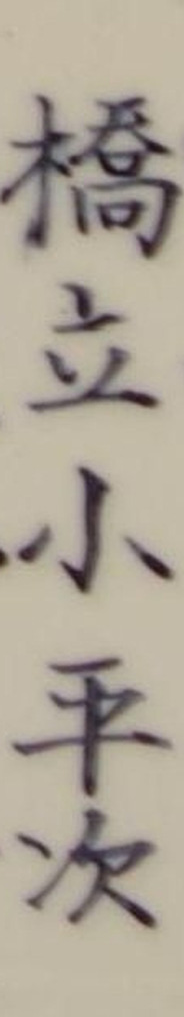橋立小平次
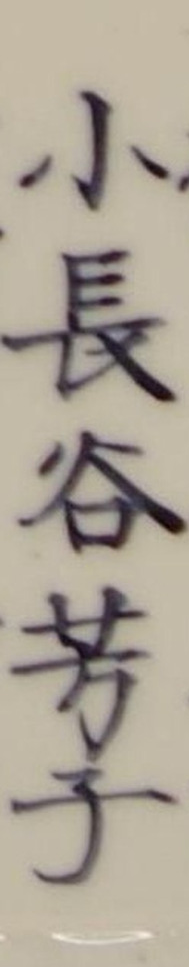小長谷芳子
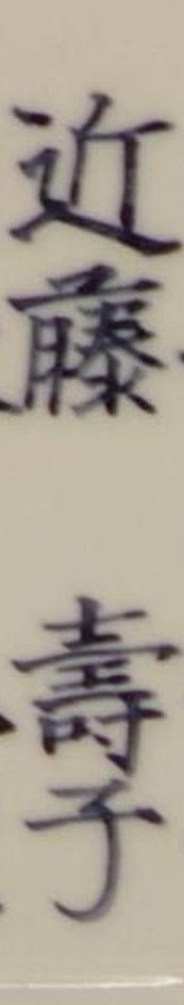近藤壽子
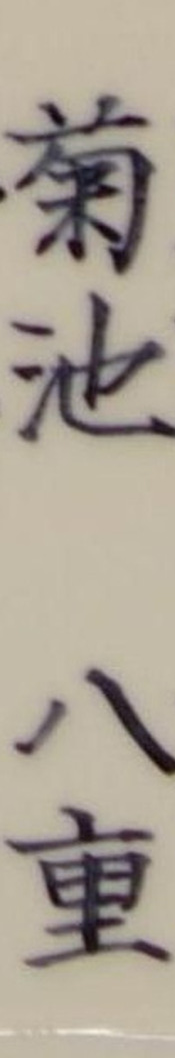菊池八重
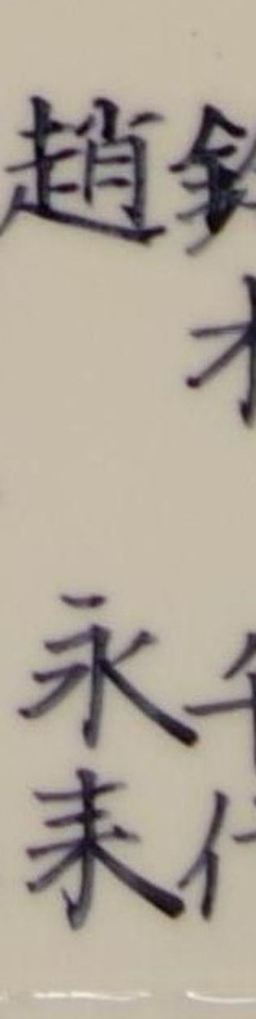趙永来
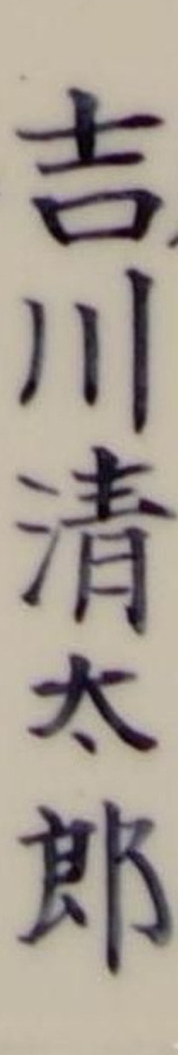吉川清太郎
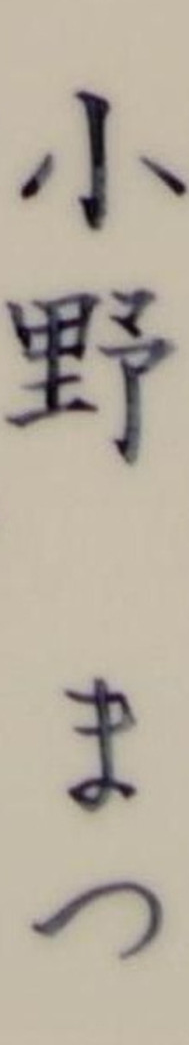小野まつ
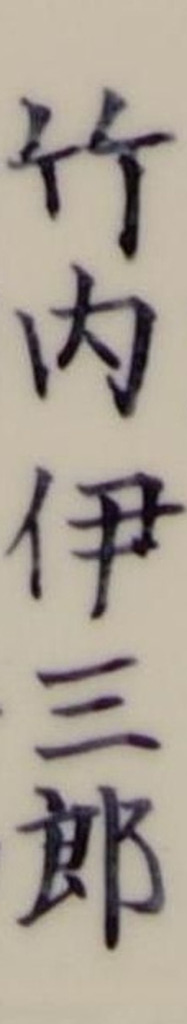竹内伊三郎
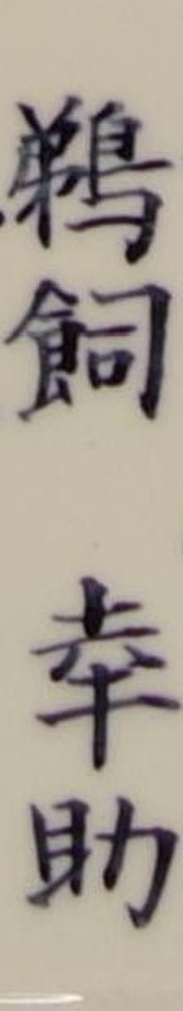鵜飼幸助
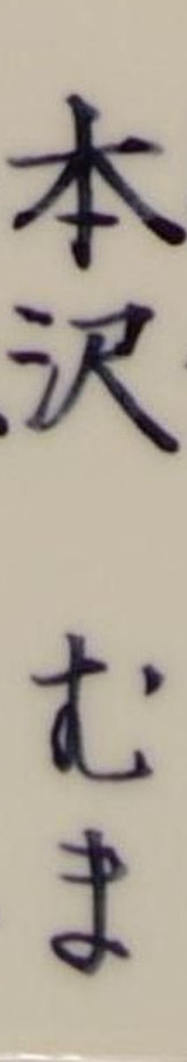本沢むま
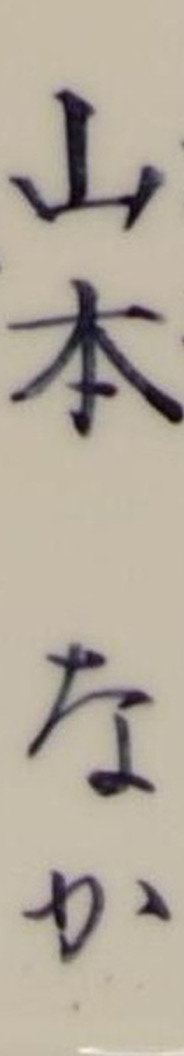山本なか
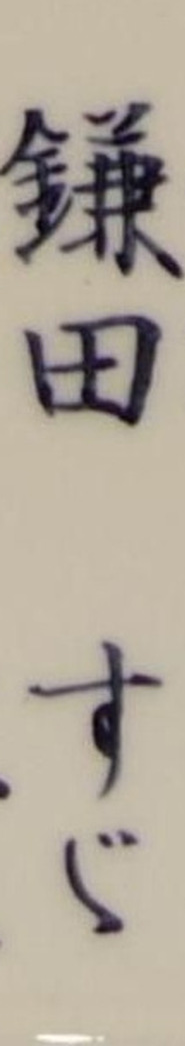鎌田すゞ
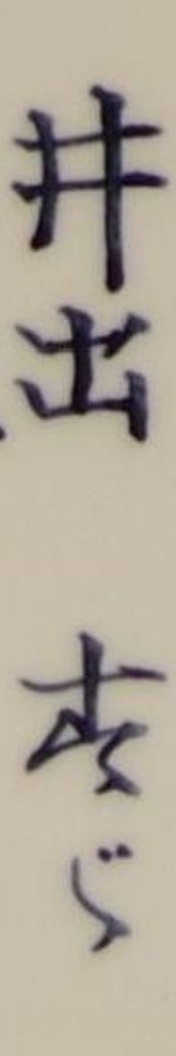井出すゞ
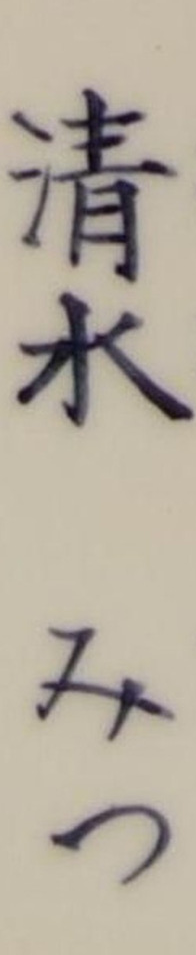清水みつ
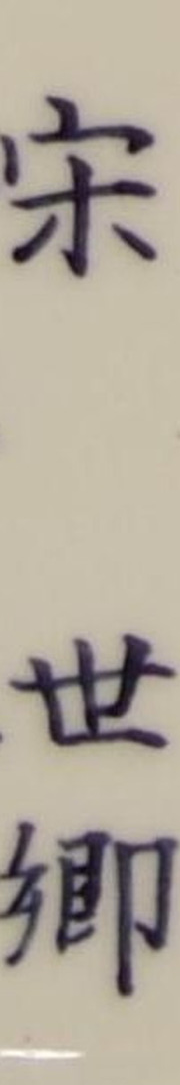宋世卿
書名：M~S
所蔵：高野山金剛峯寺
